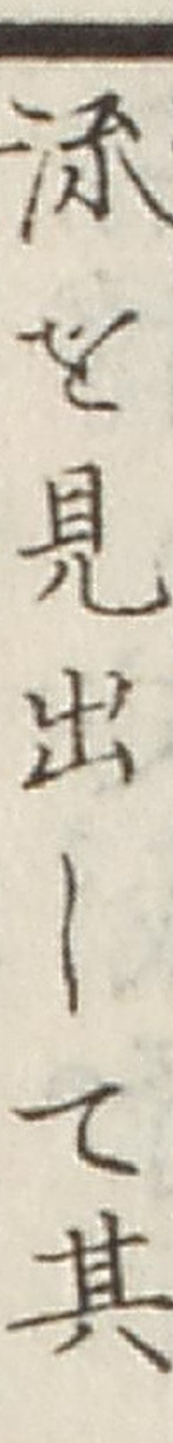流を見出して其
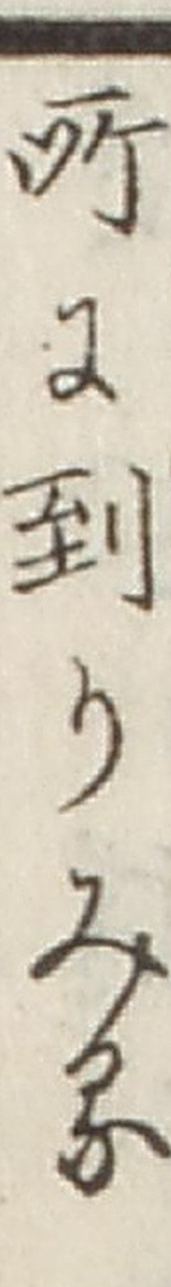所に到りみる
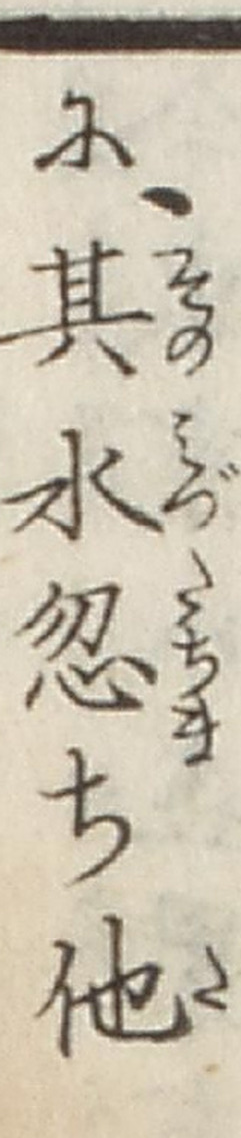に、其水忽ち他
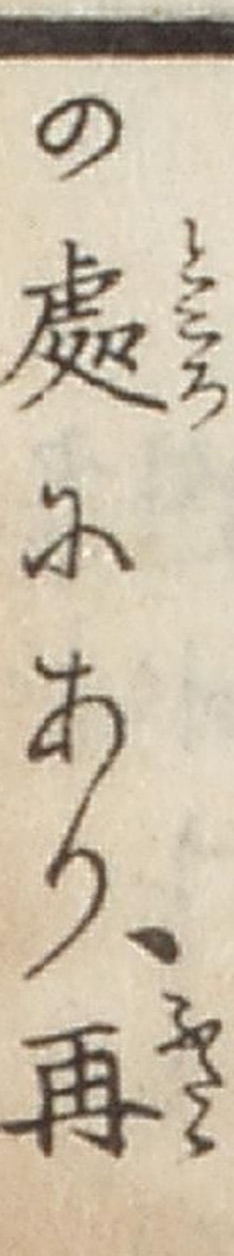の処にあり、再
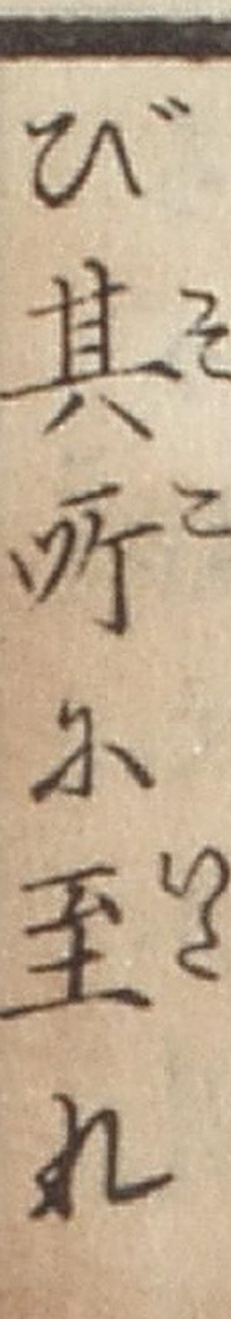び其所に至れ
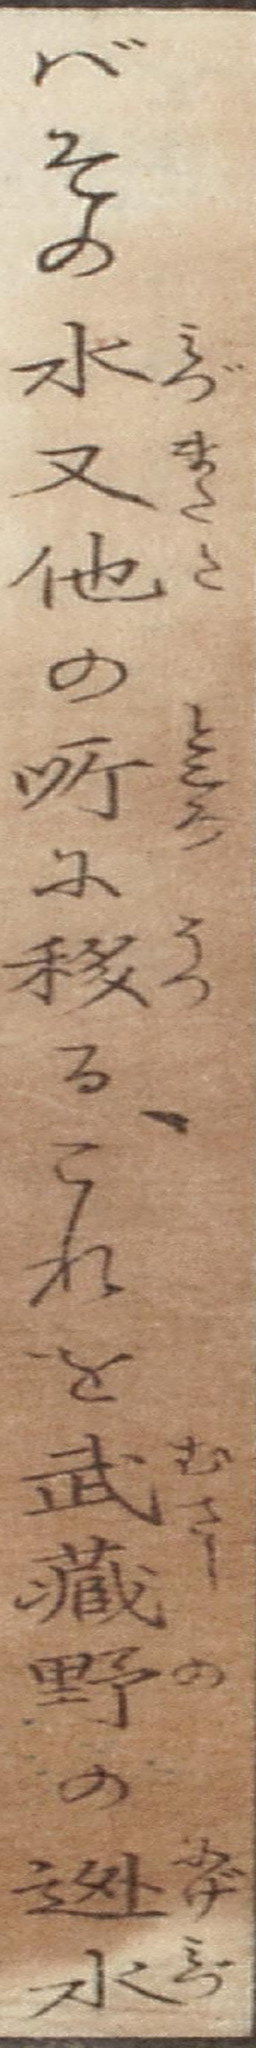ばその水又他の所に移る、これを武蔵野の逃水
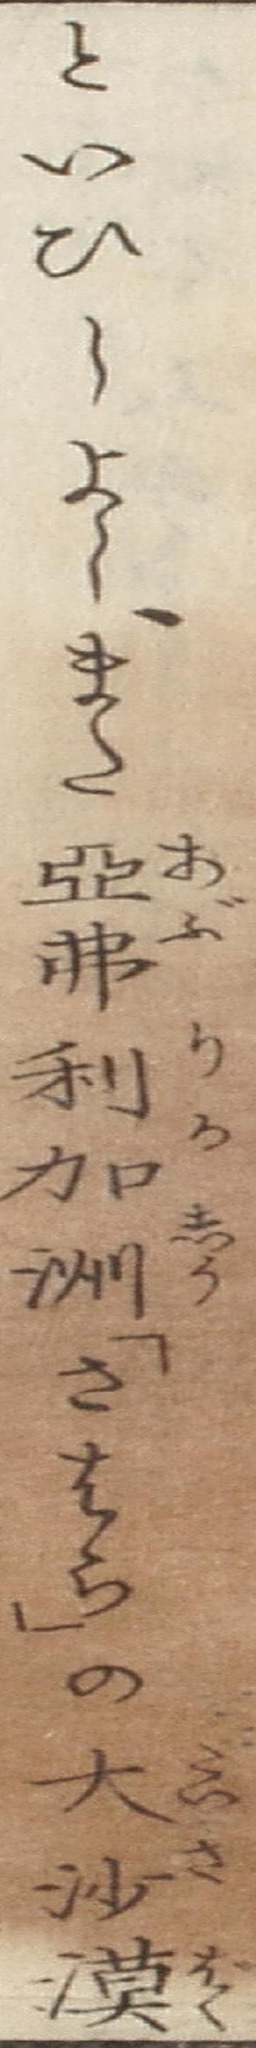といひしよし、また亜弗利加洲「さはら」の大沙漠
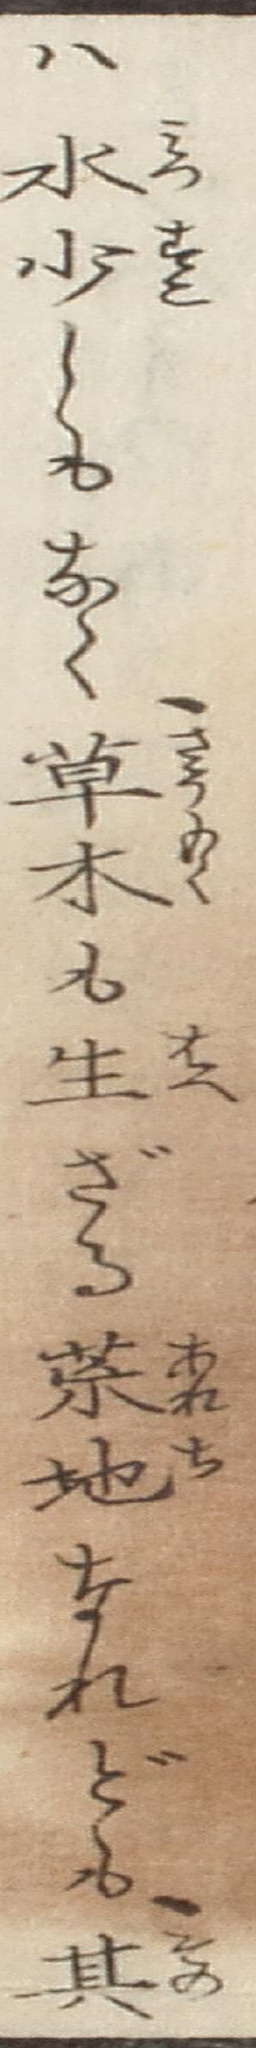は水少しもなく、草木も生ざる荒地なれども、其
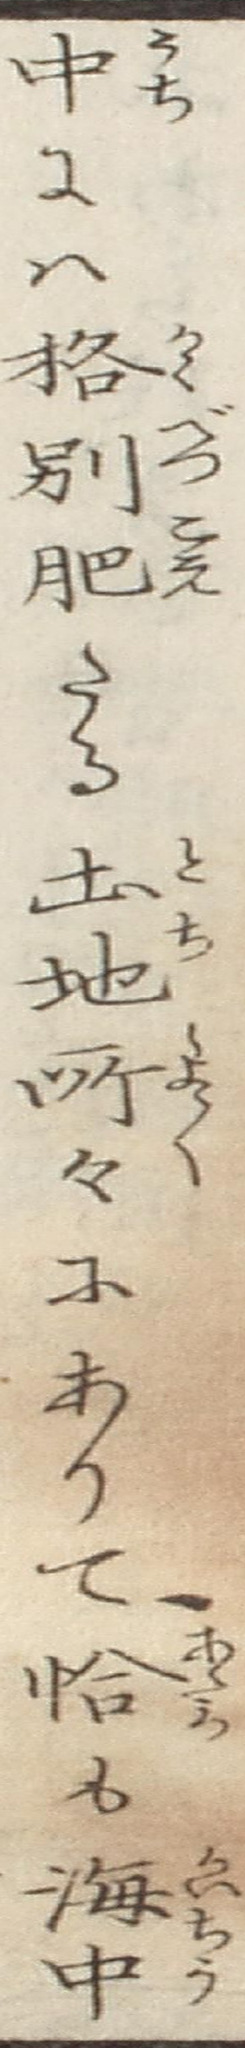中には格別肥たる土地所々にありて、恰も海中
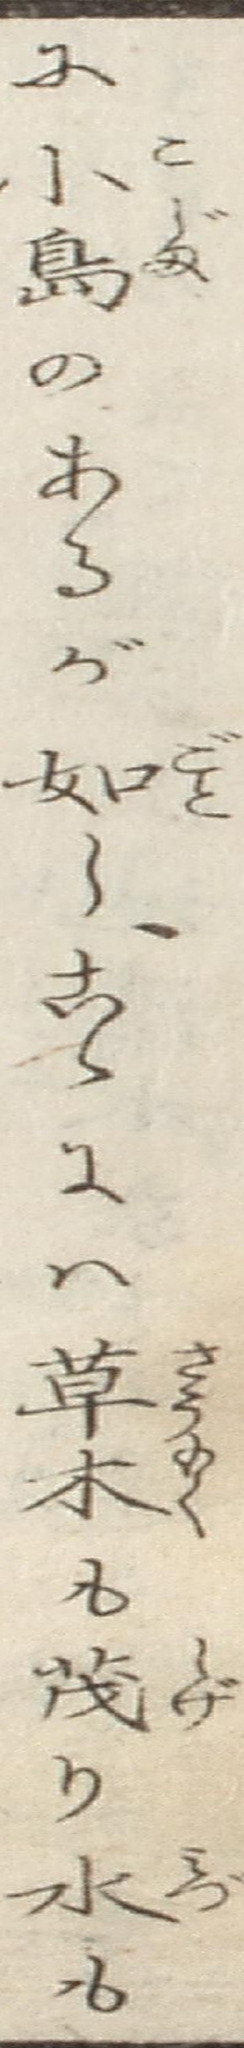に小島のあるが如し、こゝには草木も茂り水も
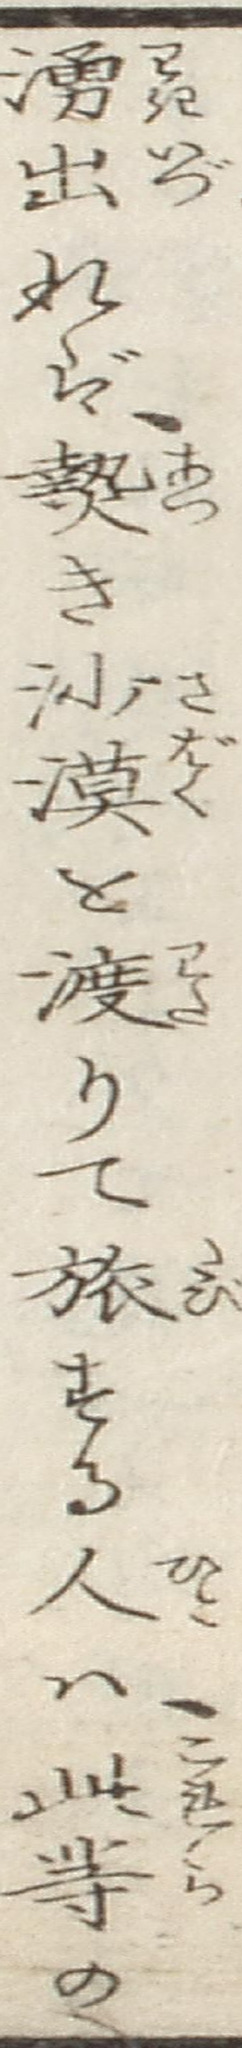湧出れば、熱き沙漠を渡りて旅する人は、此等の
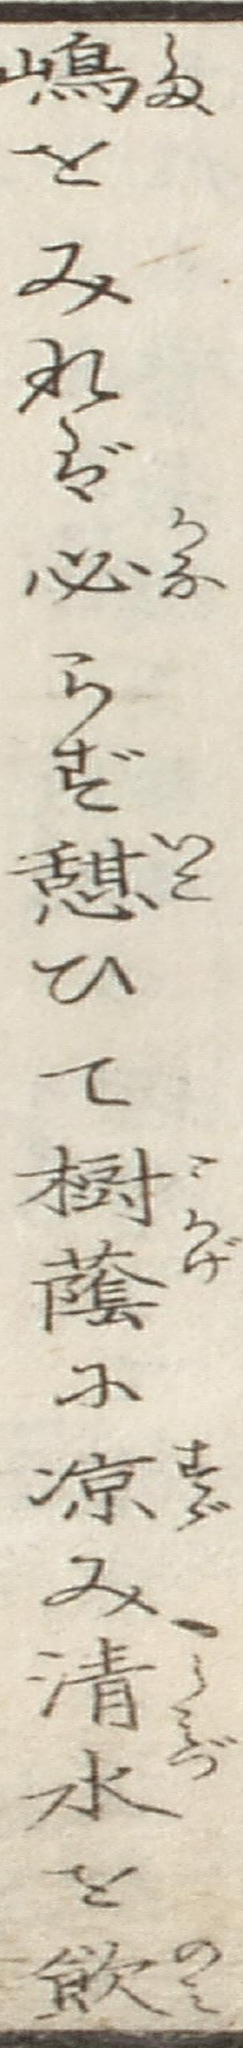嶋をみれば必らず憩ひて樹陰に涼み、清水を飲
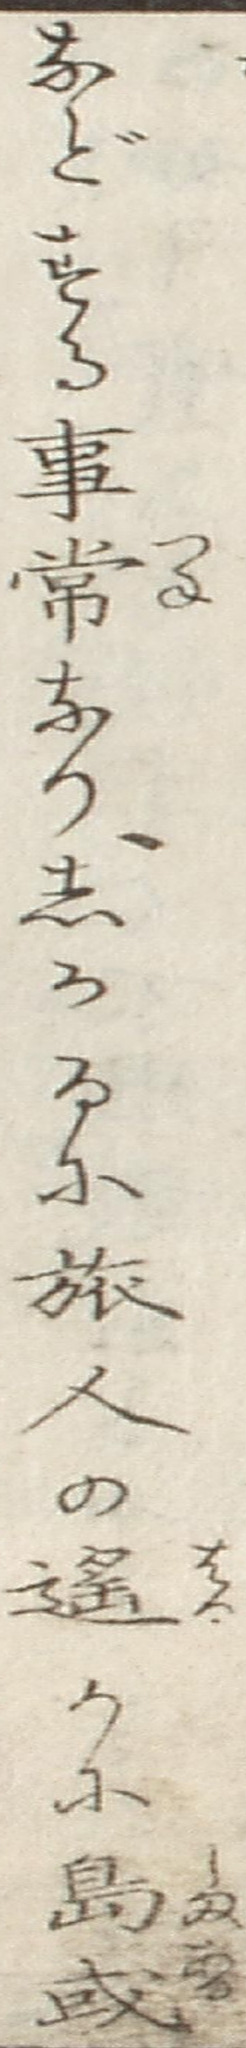などする事常なり、しかるに旅人の遥かに島或
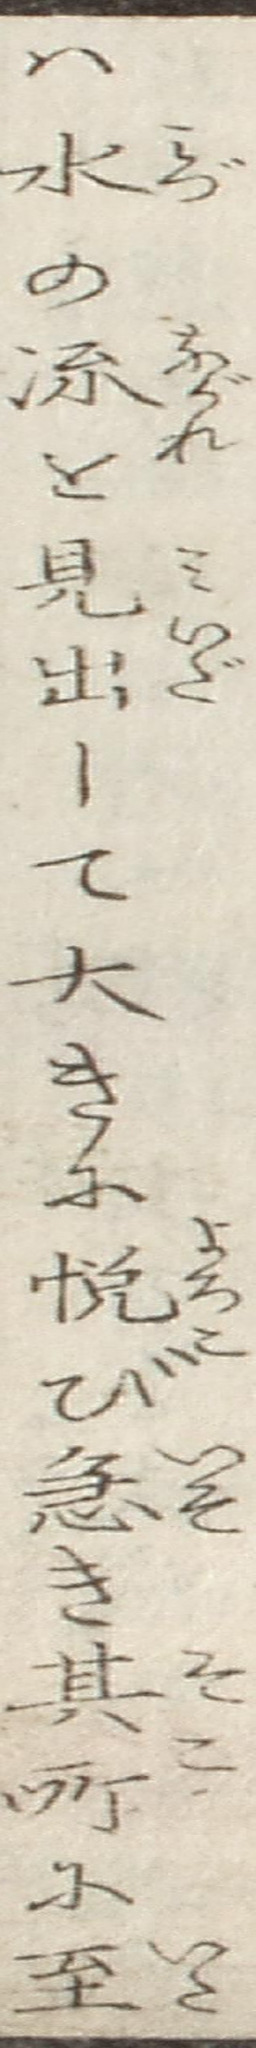は水の流れを見出して大きに悦び急き其所に至

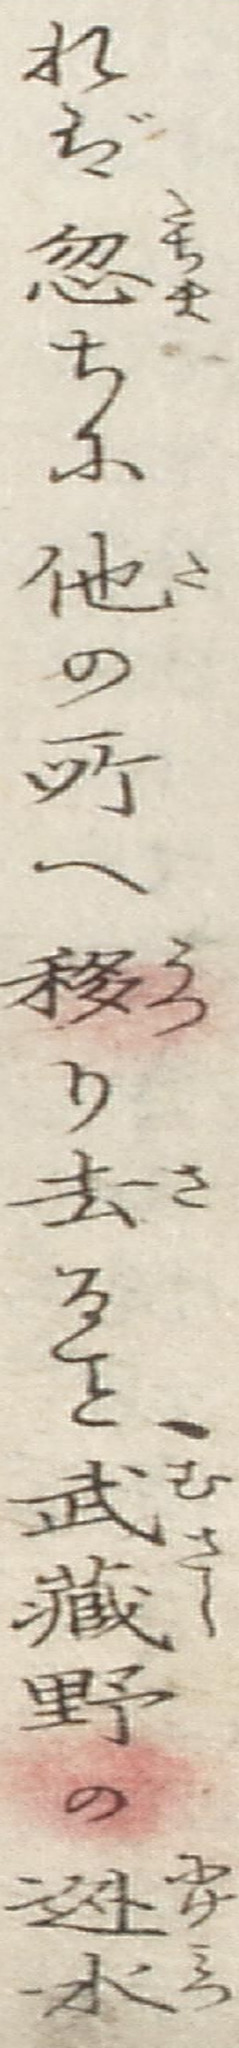れば忽ちに他の所へ移り去ること、武蔵野の逃水
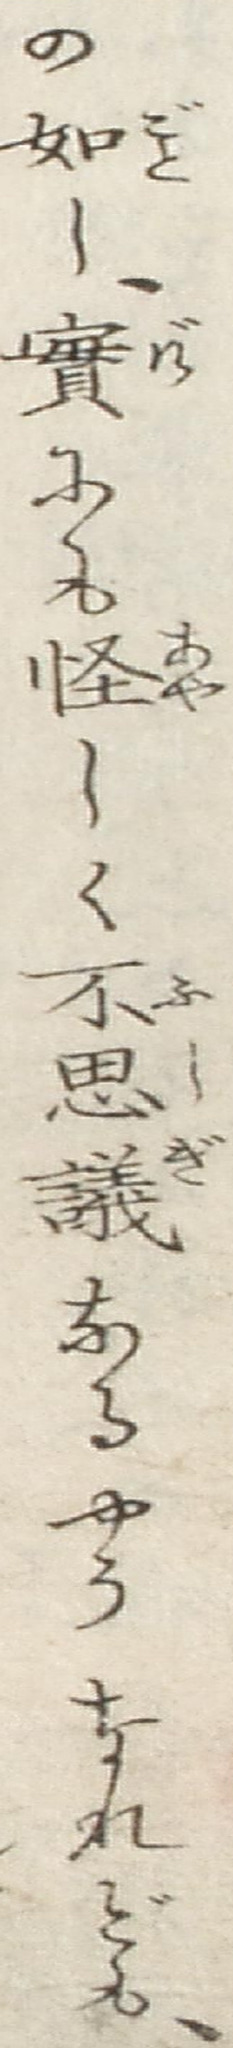の如し、実にも怪しく不思議なるやうなれども、
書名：変異辯　一名、天變地異拾遺　全
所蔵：東京大学地震研究所図書室 Earthquake Research Institute Library, The University of Tokyo, JAPAN
